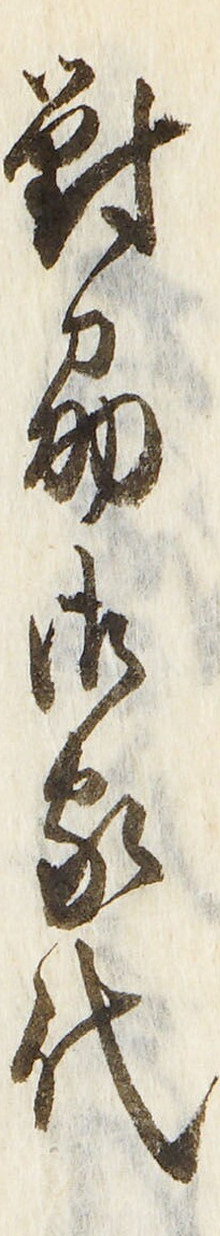対州御家代
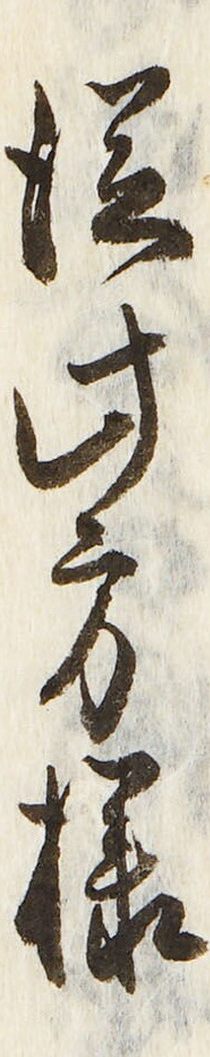従此方様
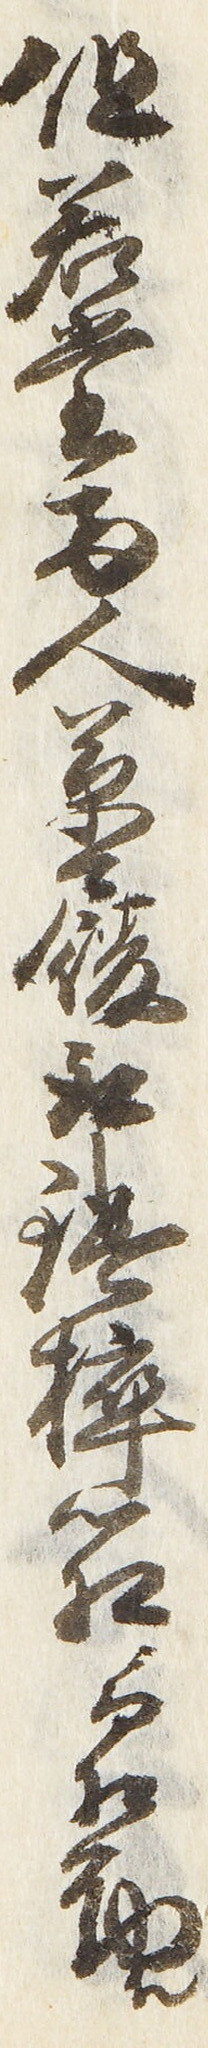但若党両人草履取鑓捽箱ニ而相勤ル
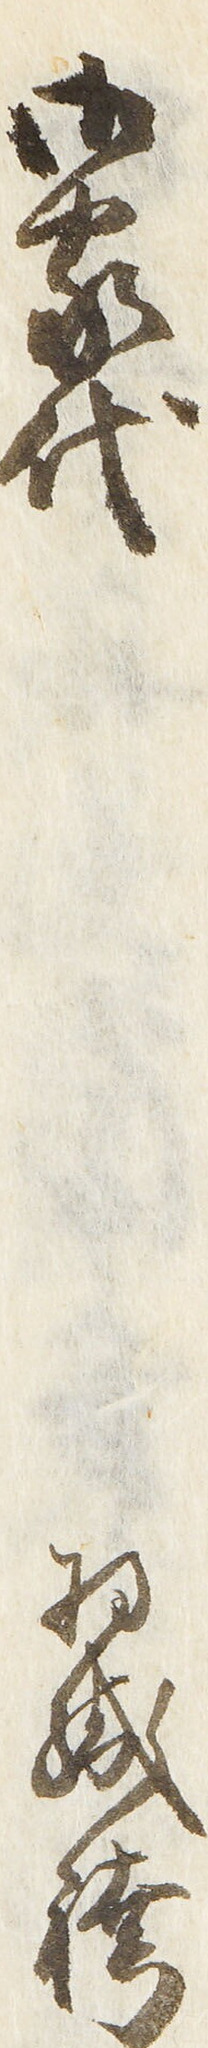御家代羽織袴
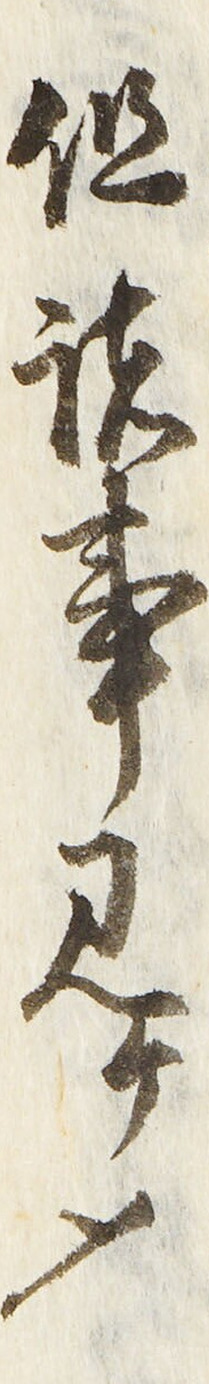但諸事見ケ〆
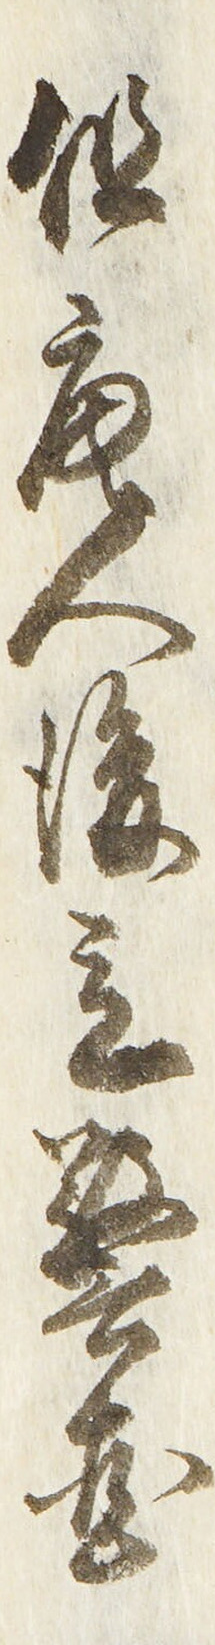但唐人後立警固

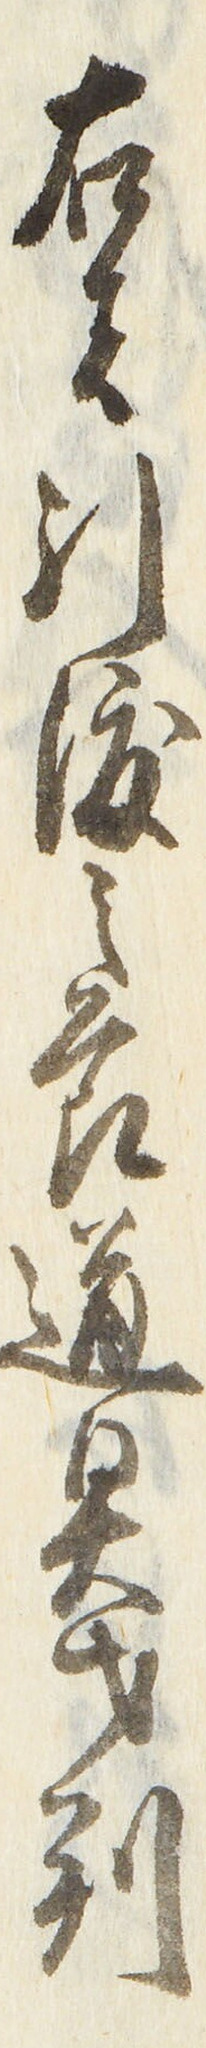右者引渡之節道具才判
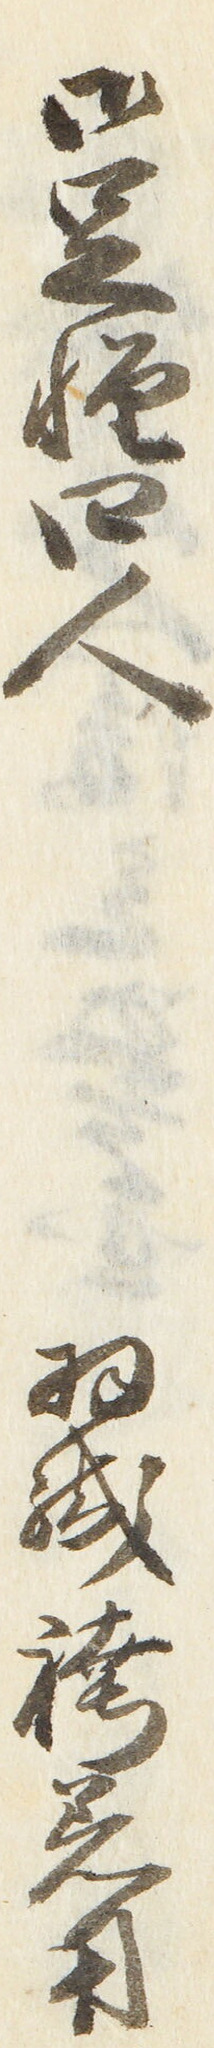御足軽四人羽織袴着用
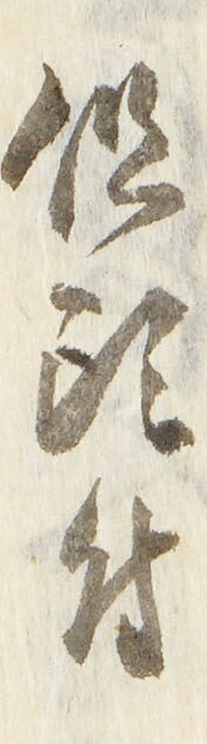但頭付
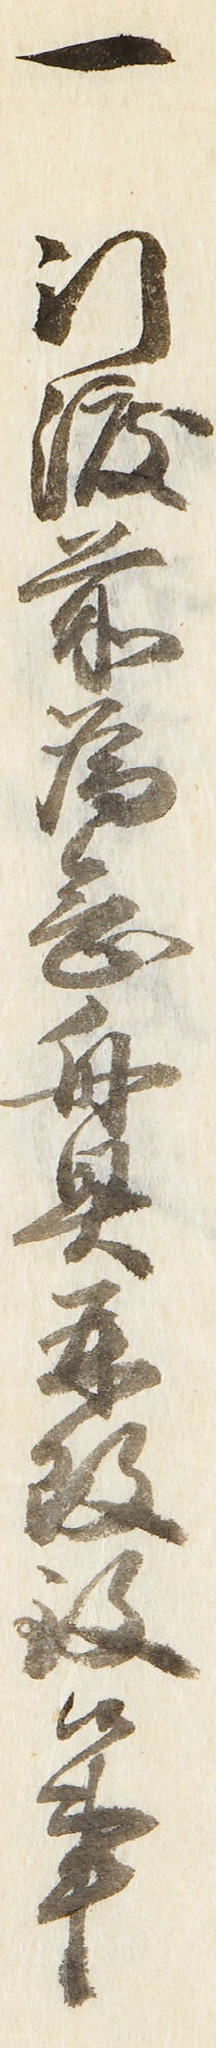一引渡前為念舟具再改致候事
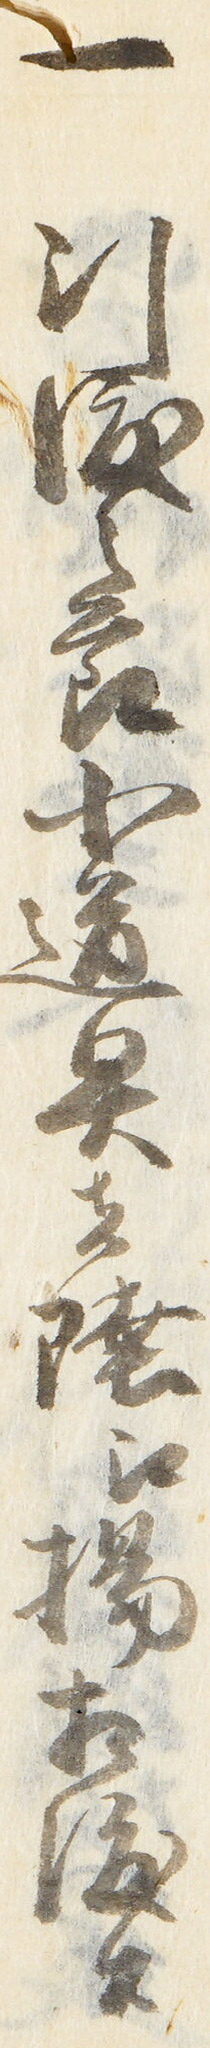一引渡之節小道具者陸江揚相渡ス
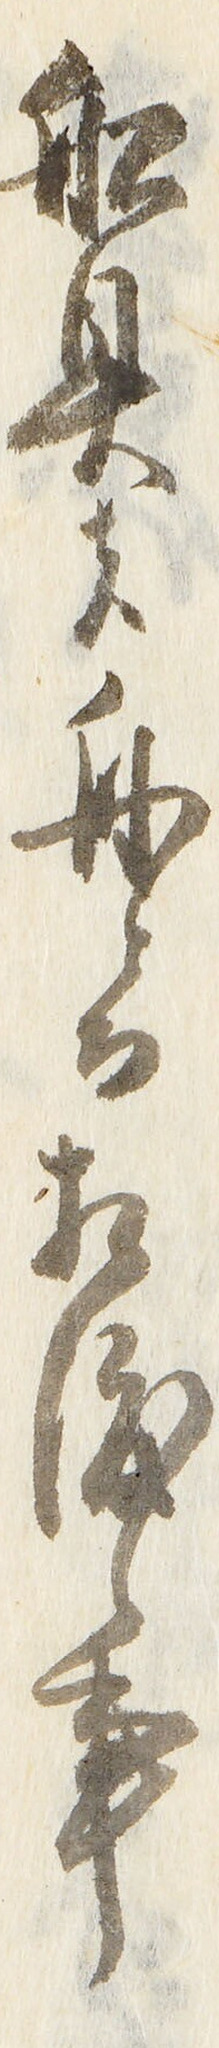船具者舟ニ而相渡候事
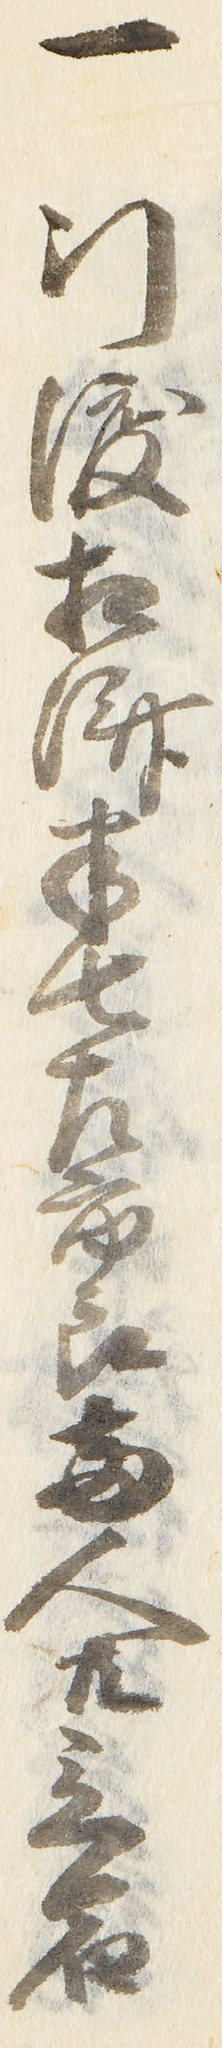一引渡相済半七左市郎両人共立宿
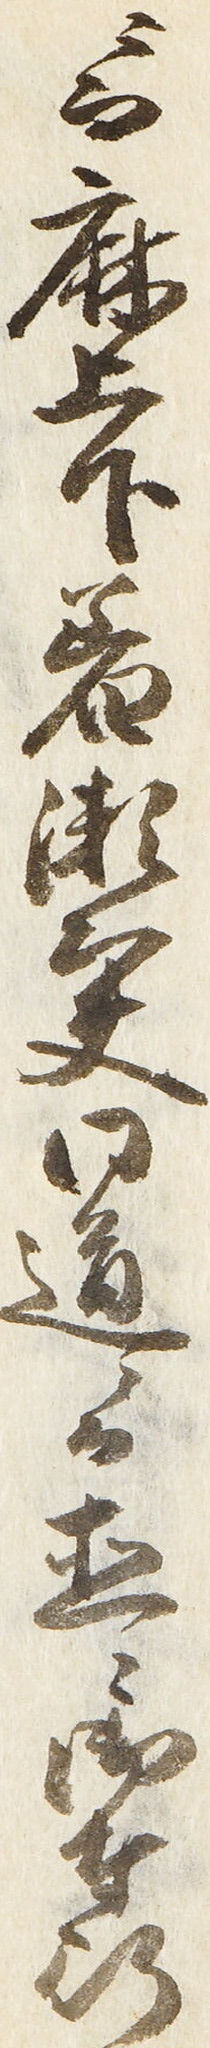ニ而麻上下着瀬大夫同道ニ而直ニ御奉行
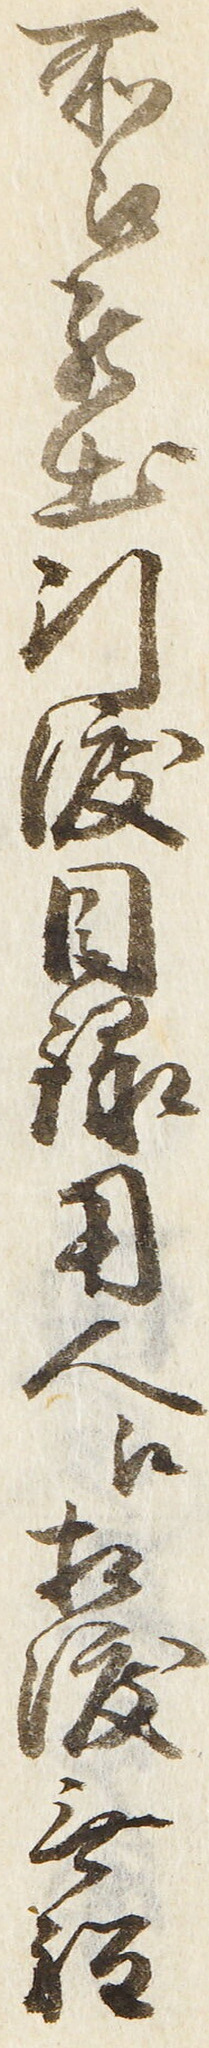所江罷出引渡目録用人江相渡無程
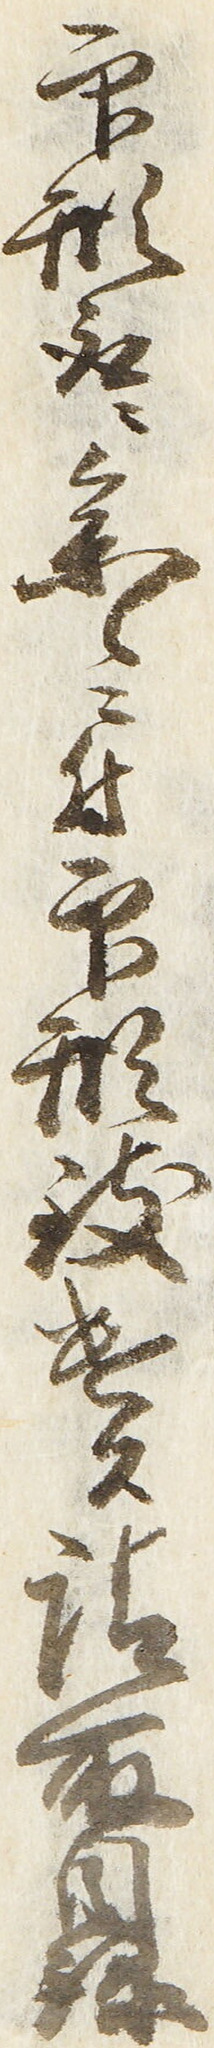印形取ニ参候ニ付印形致遣ス請取目録
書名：玄海嶋江漂着船為警固長崎江被越候覚
